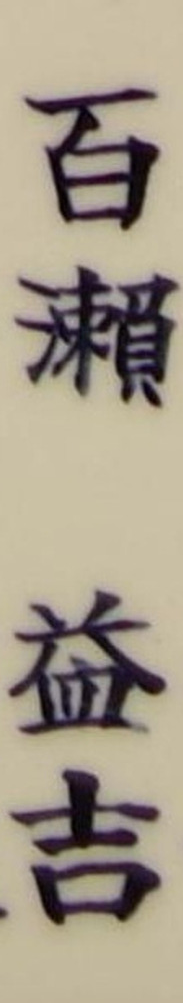百瀨益吉
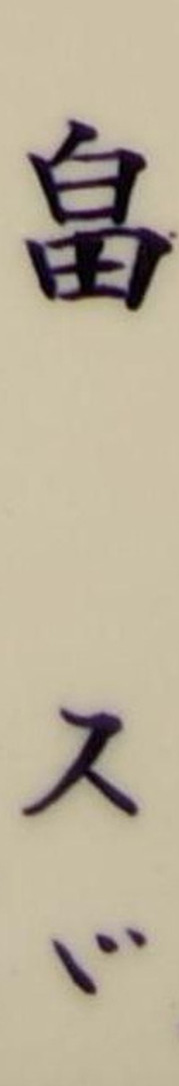畠スズ
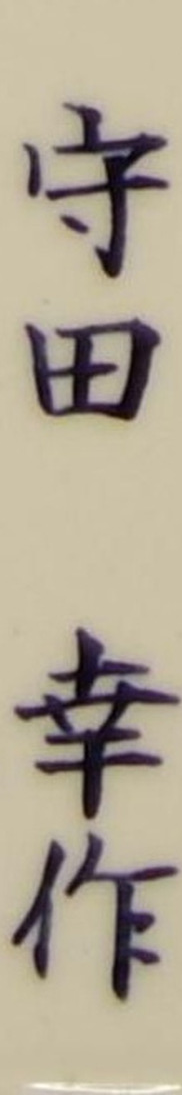守田幸作
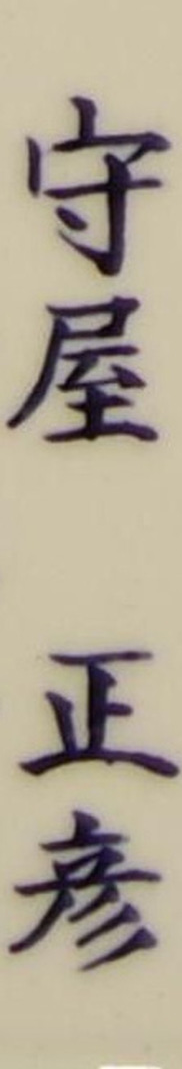守屋正彦
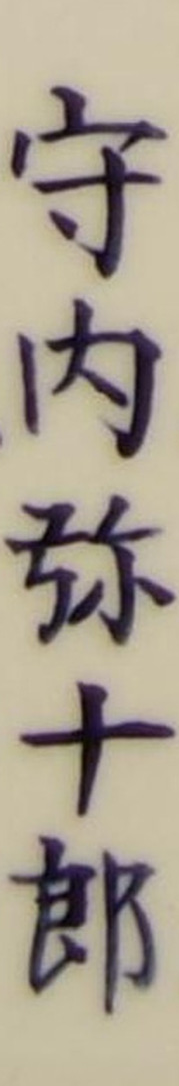守内弥十郎
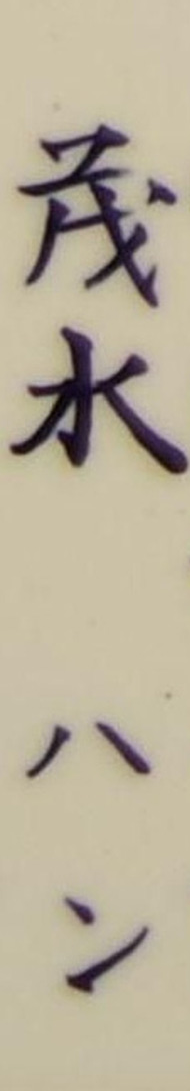茂水ハン

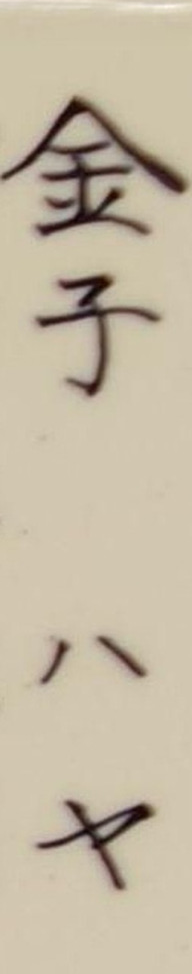金子ハヤ
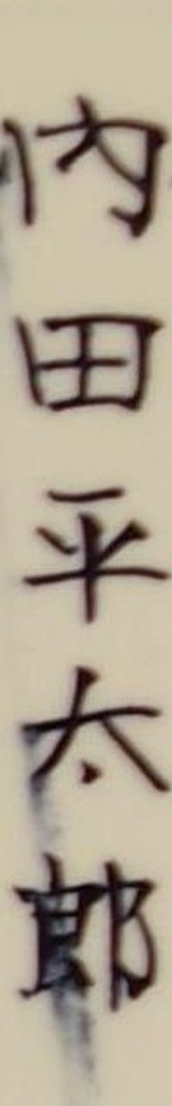内田平太郎
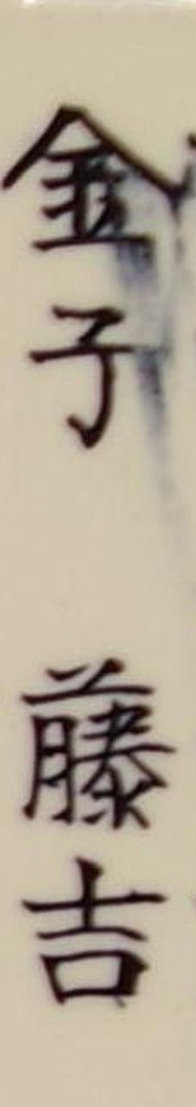金子藤吉
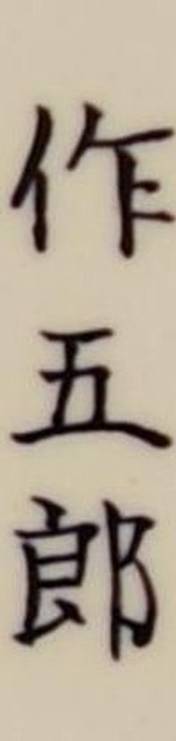作五郎
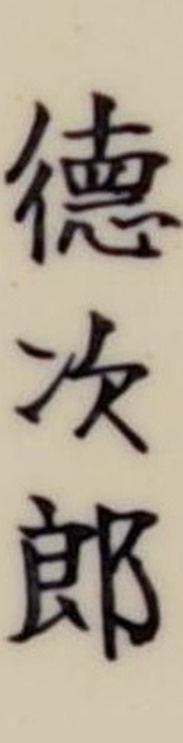徳次郎
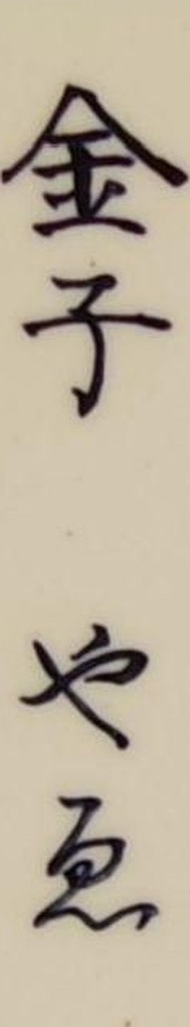金子やゑ
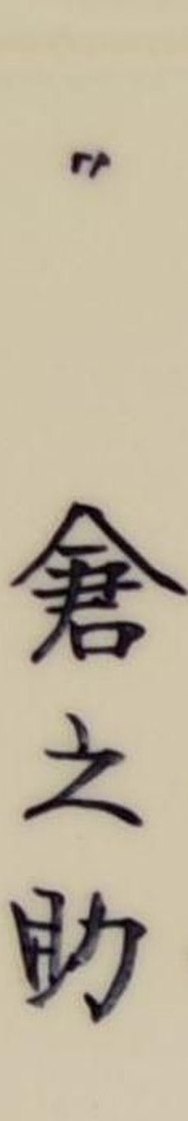倉之助
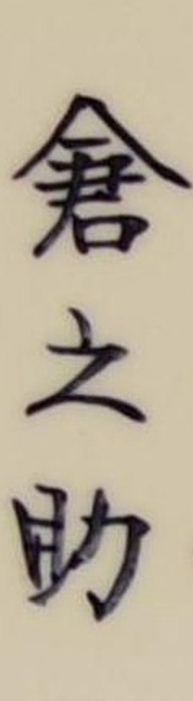倉之助
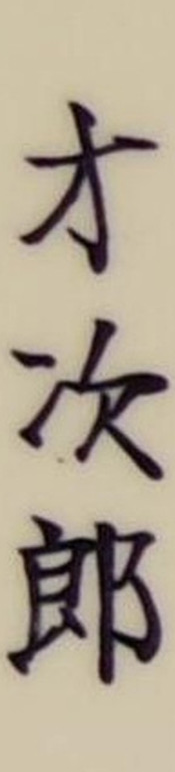才次郎
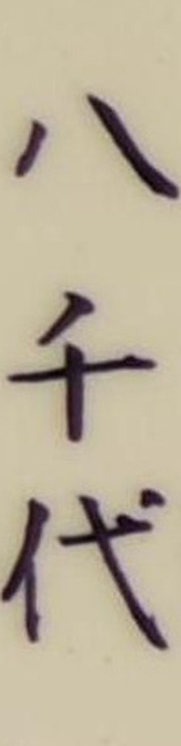八千代
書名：A~D
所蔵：koyasan kongobuji
